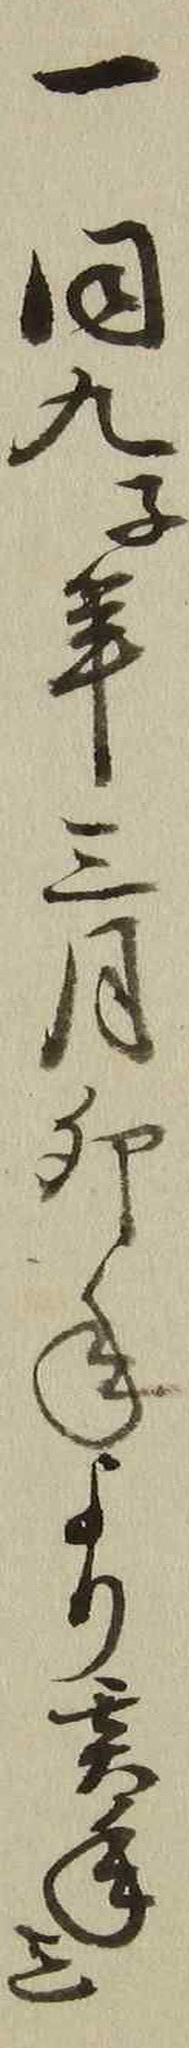一同九子年三月卯年より亥年迄
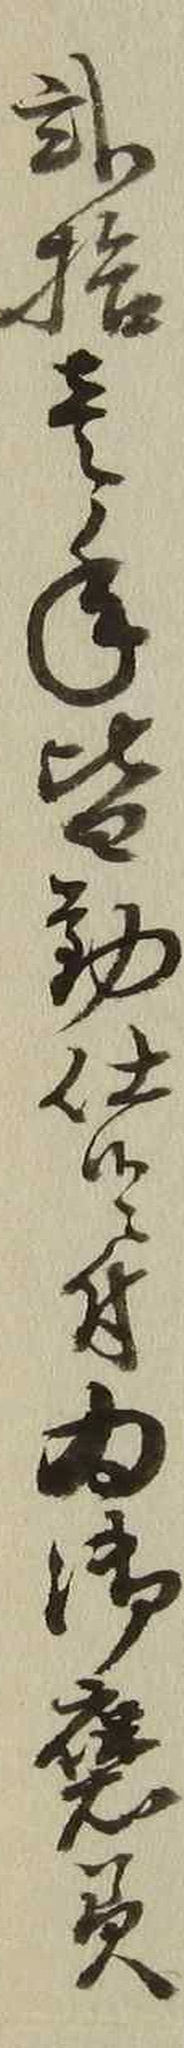弐拾壱年皆勤仕候ニ付為御褒美
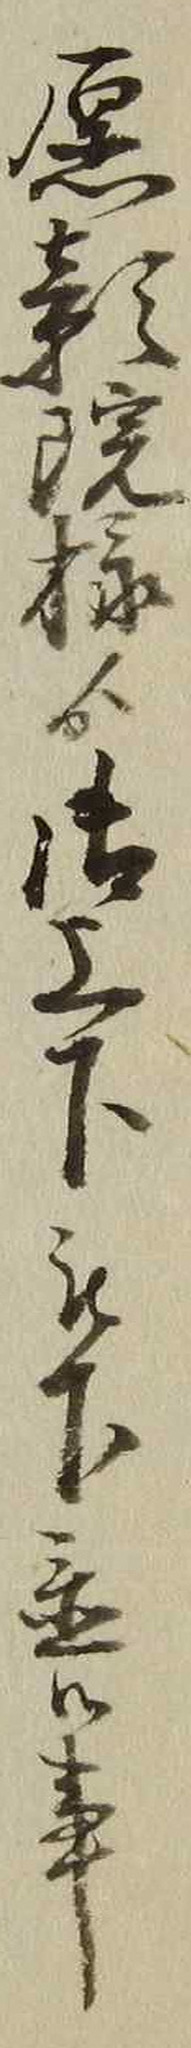愿彰院様ゟ御上下被下置候事
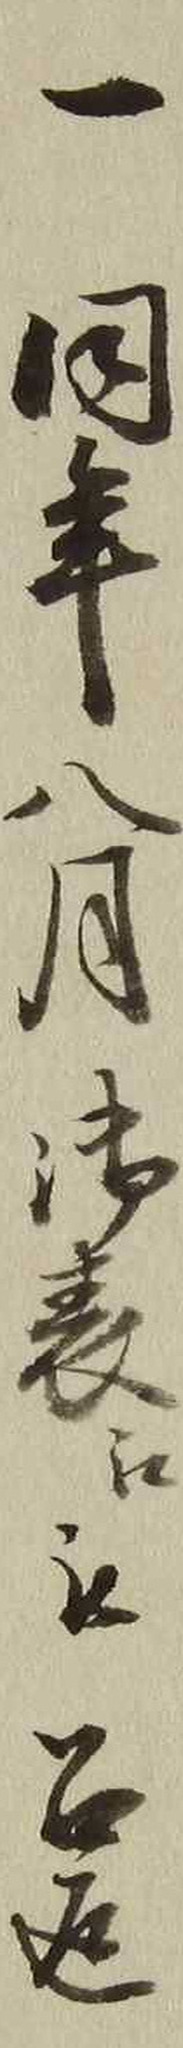一同年八月御表江被召返
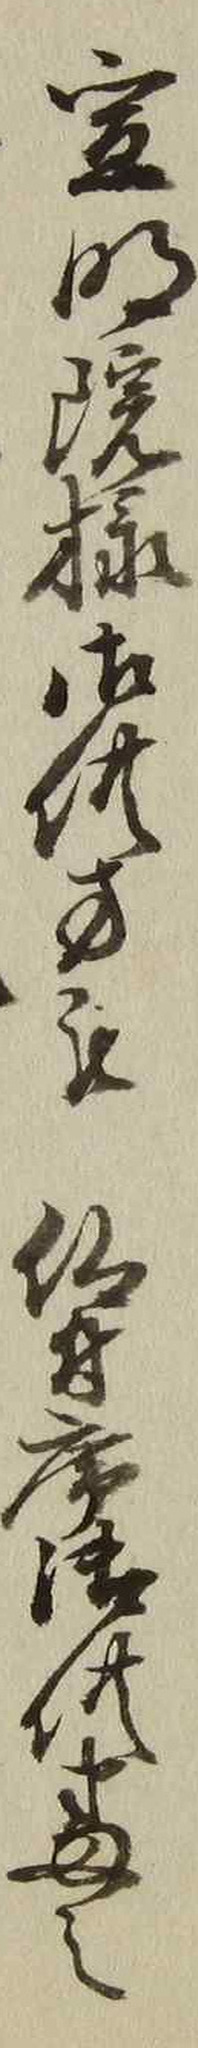宣明院様御供方被仰付席御供番之
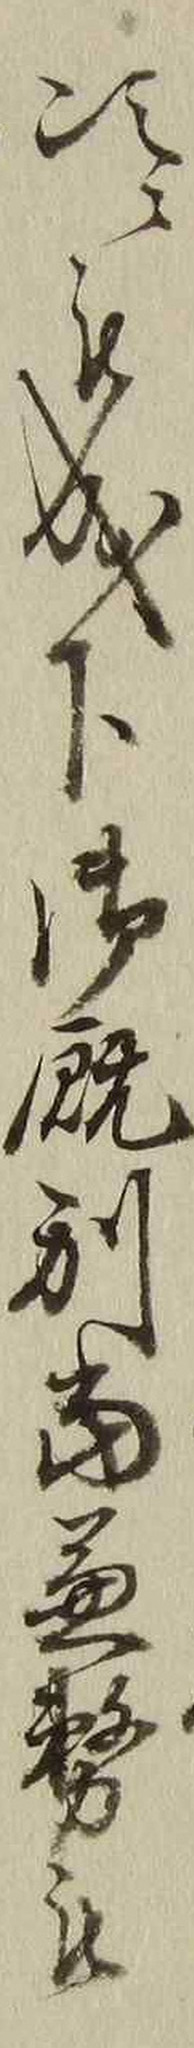次ニ被成下御厩別当兼務被
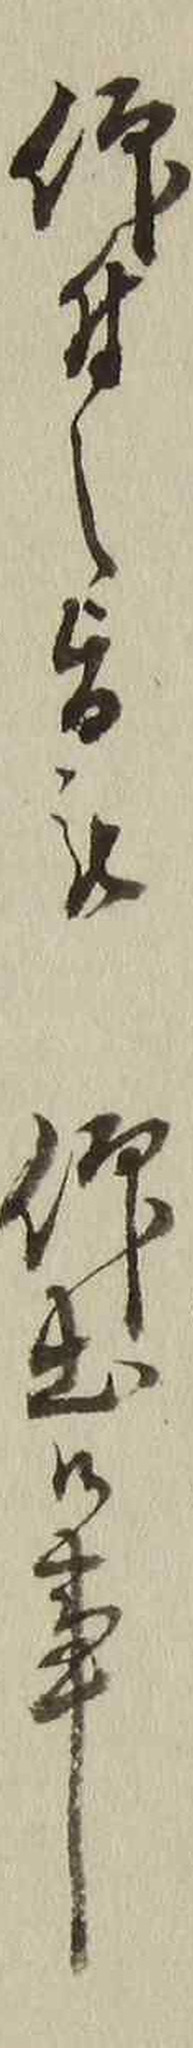仰付之旨被仰出候事
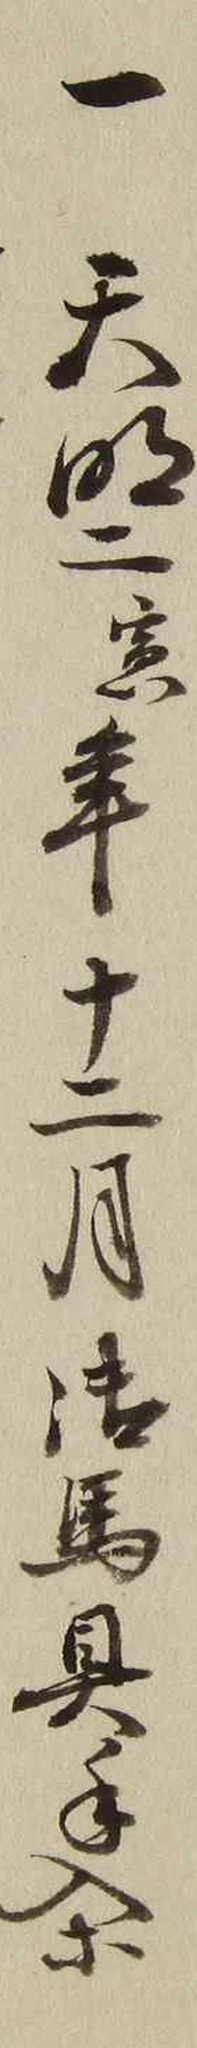一天明二寅年十二月御馬具手入等
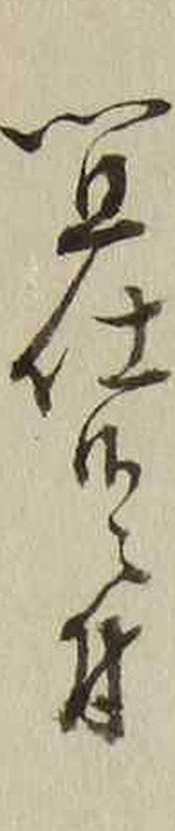宜仕候ニ付
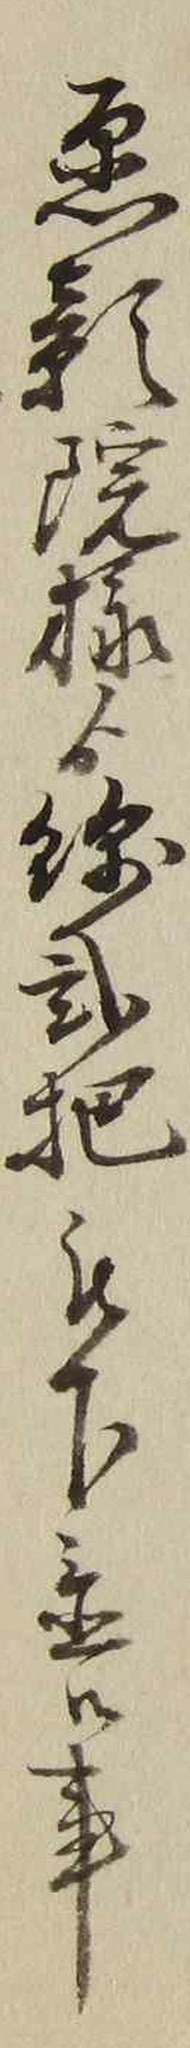愿彰院様ゟ綿弐把被下置候事
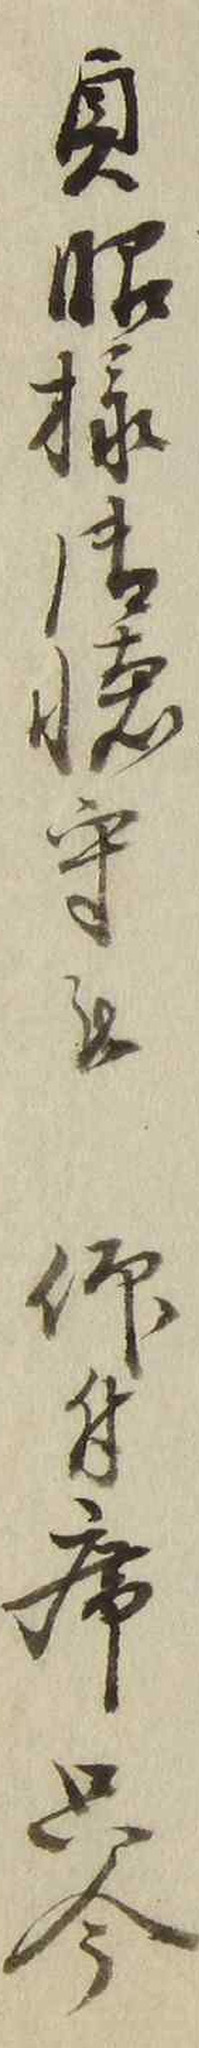貞昭様御懐守被仰付席只今

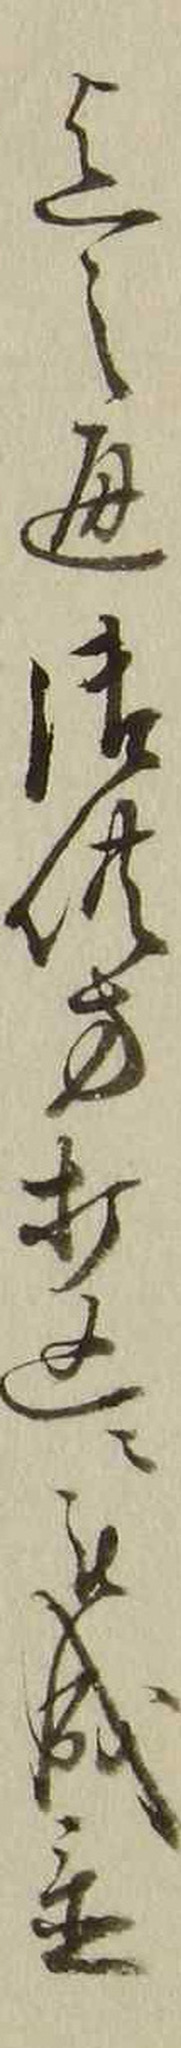迄之通御供方打込ニ被成置
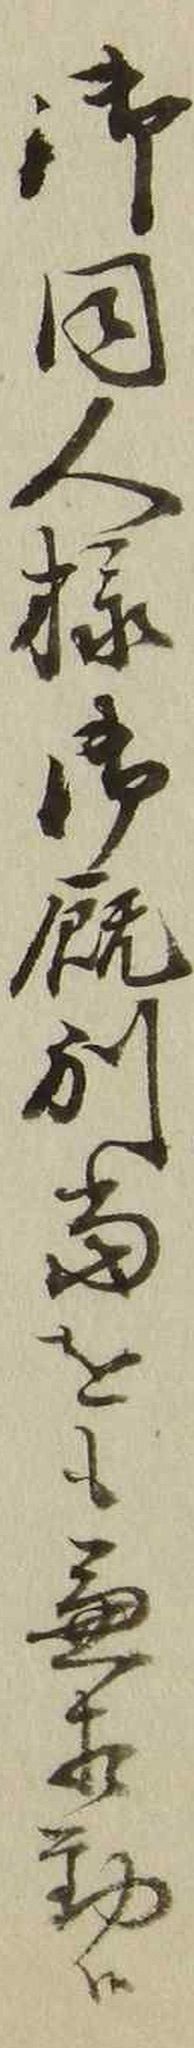御同人様御厩別当をも兼相勤候
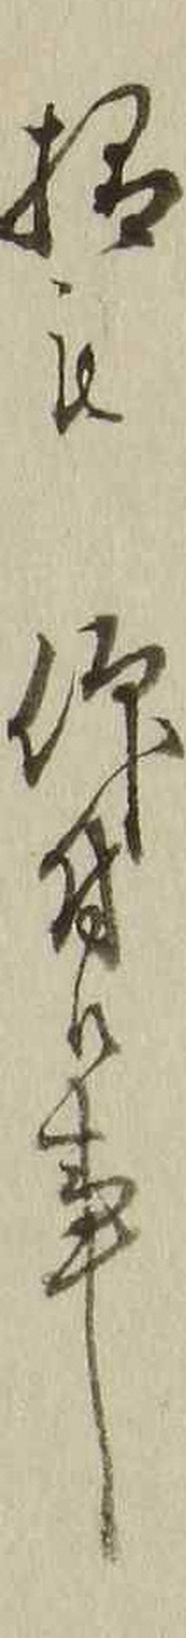様被仰付候事
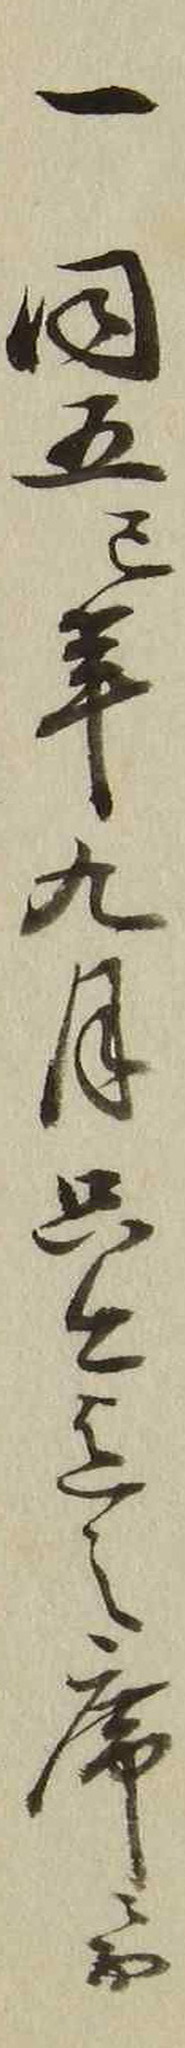一同五巳年九月只今迄之席ニ而
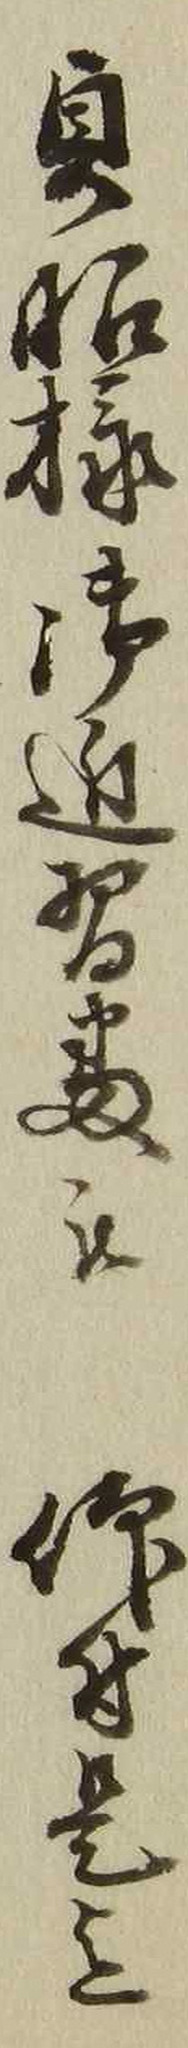貞昭様御近習番被仰付是迄
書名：諸士系譜　巻之31　い之部31
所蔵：会津若松市立会津図書館
